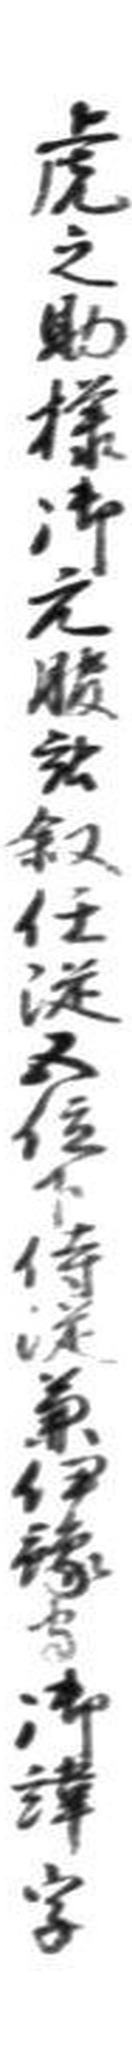虎之助様御元服被叙任従五位下侍従兼伊予守御諱字

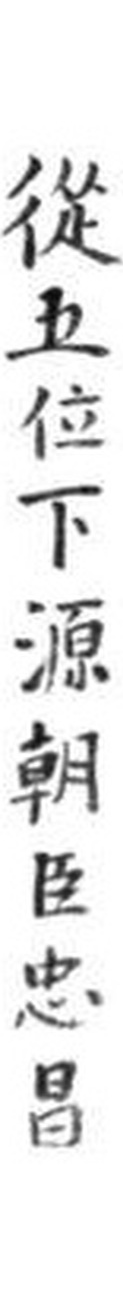従五位下源朝臣忠昌
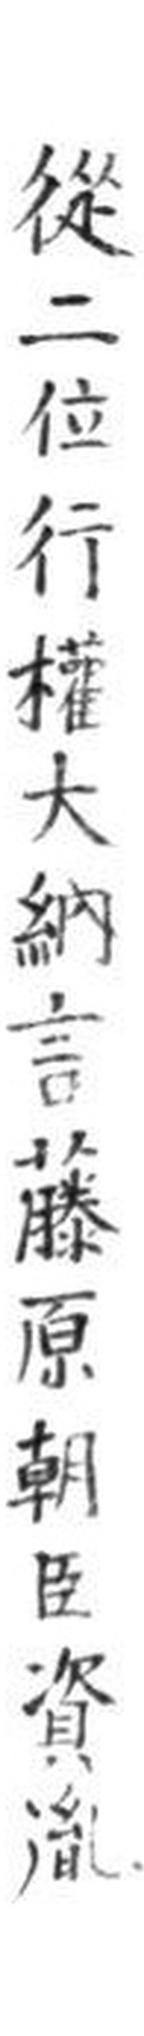従二位行権大納言藤原朝臣資胤
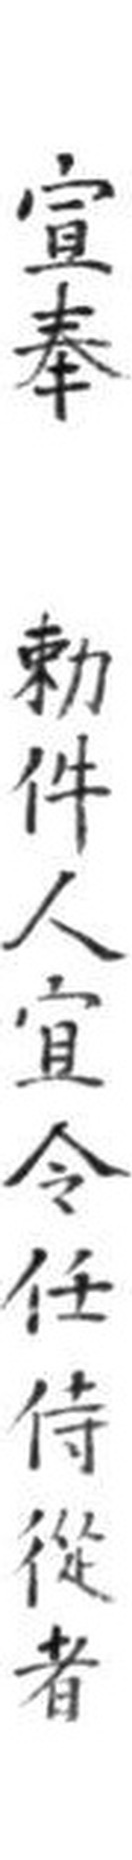宣奉勅件人宜令任侍従者
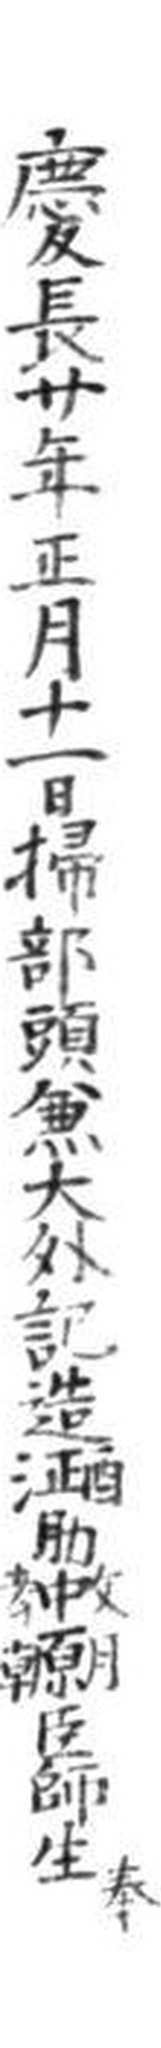慶長廿年正月十一日掃部頭兼大外記造酒助教中原朝臣師生奉
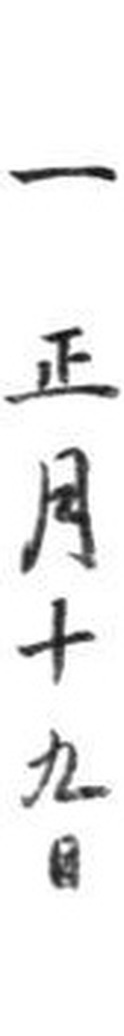一正月十九日
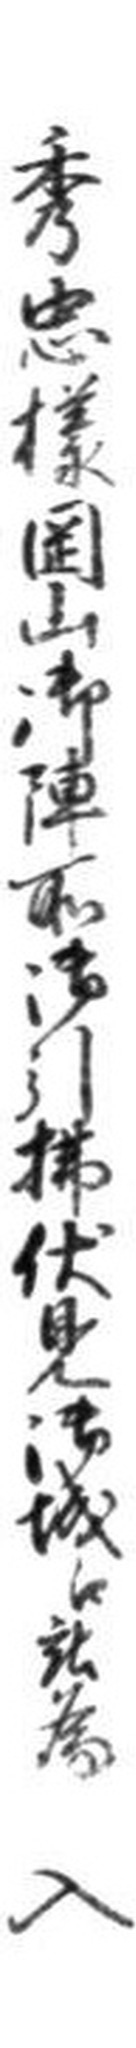秀忠様岡山御陣所御引払伏見御城江被為入
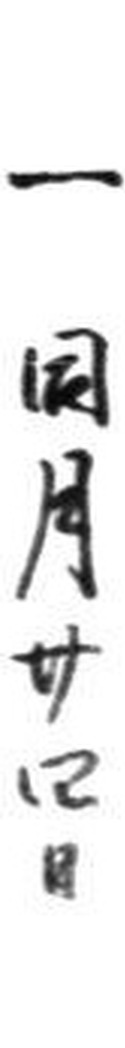一同月廿四日
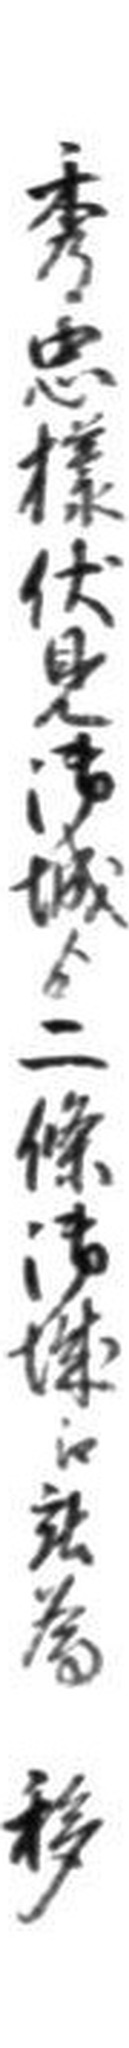秀忠様伏見御城ゟ二条御城江被為移
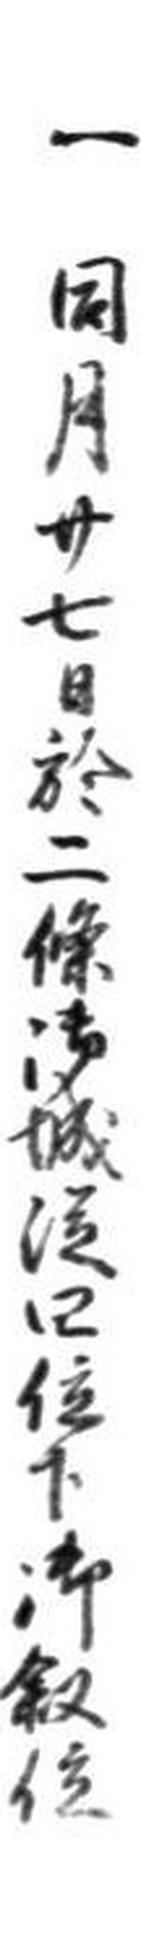一同月廿七日於二条御城従四位下御叙位
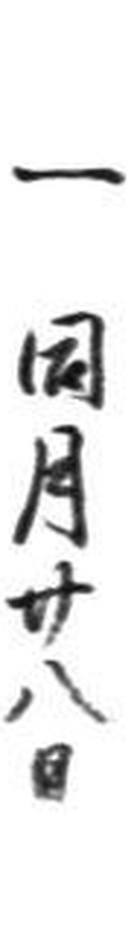一同月廿八日
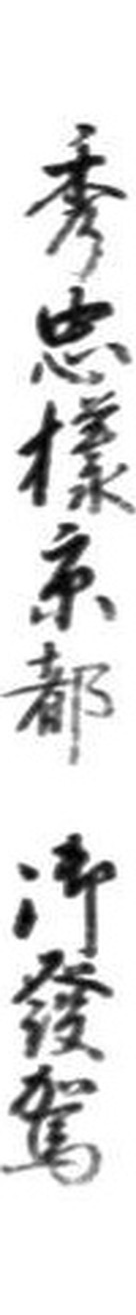秀忠様京都御発駕
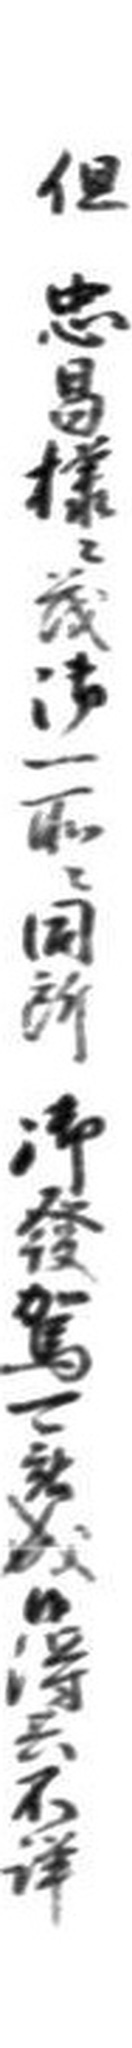但忠昌様ニも御一所ニ同所御発駕可被成候得共不詳
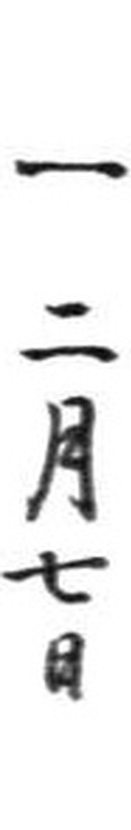一二月七日
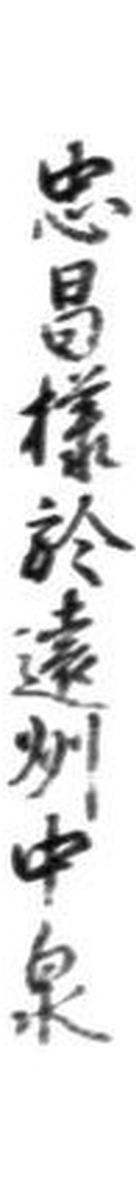忠昌様於遠州中泉
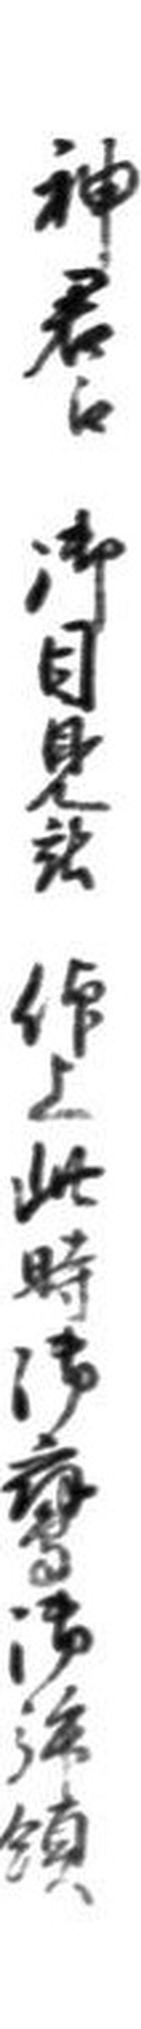神君江御目見被仰上此時御鷹御拝領
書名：家譜 三 忠昌公 従慶長八年到寛永六年
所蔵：福井県文書館 Fukui Prefectural Archives
